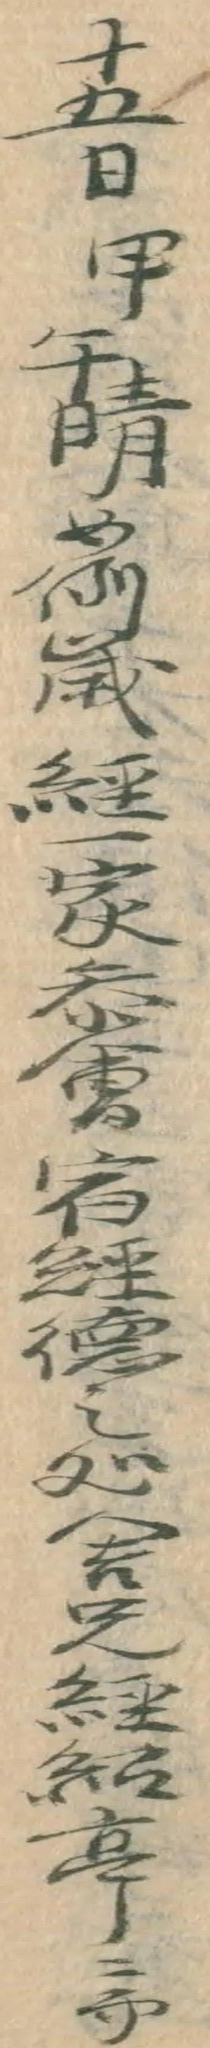十五日甲午晴如何歳経一家参會宿経徳之処舎兄経紹亭ニ而

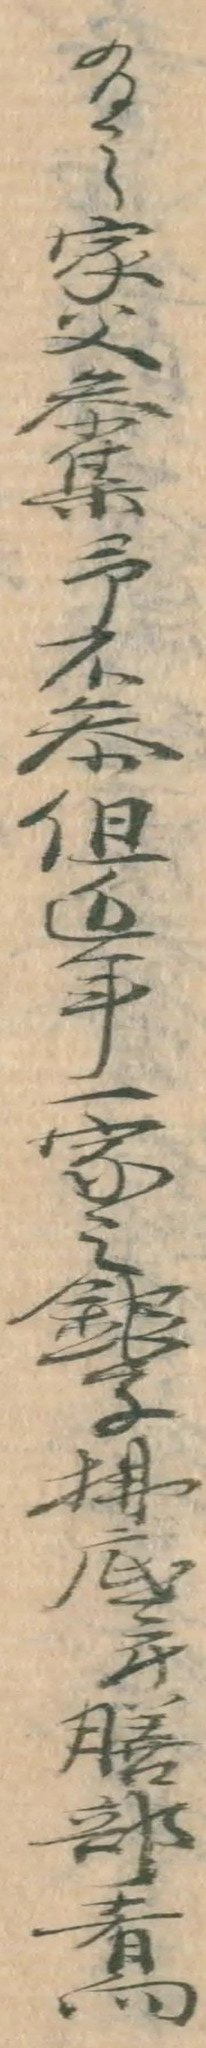有之家父参集予不参但近年一家之銀子払底ニ付膳部肴向
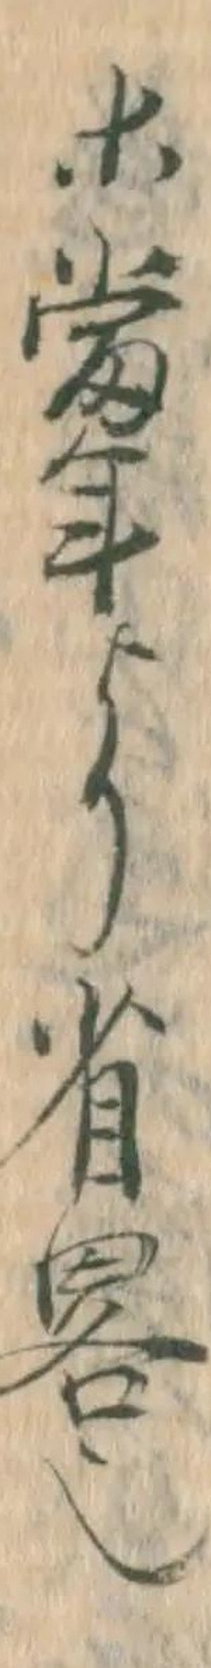御當年より省略也
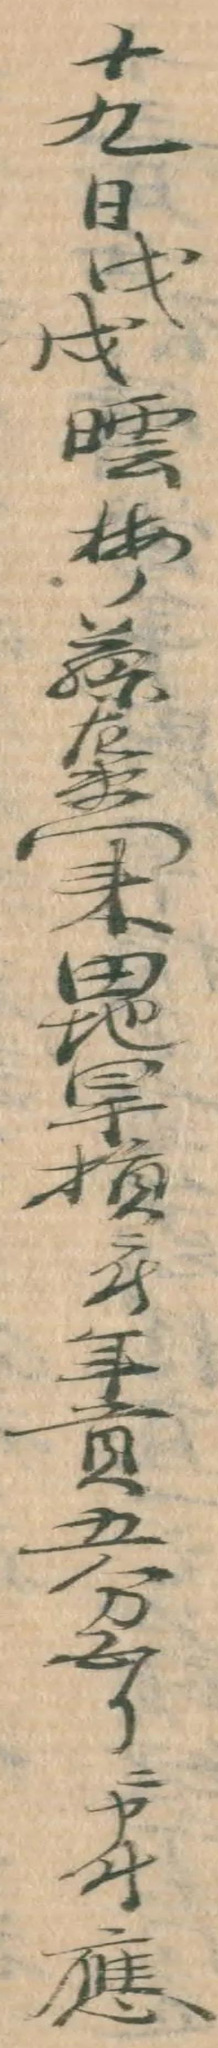十九日戊戌曇梅ノ藤左衛門来田地旱損ニ付年貢五分ふりニ申付應
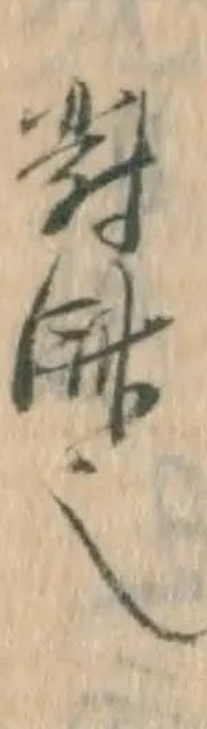對済也
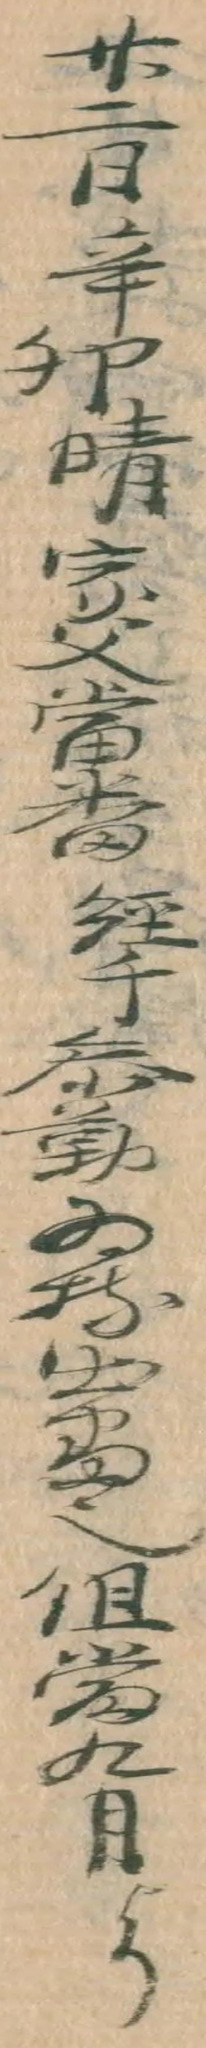廿二月辛卯晴家父當番経千参勤為持出番也但當九月より
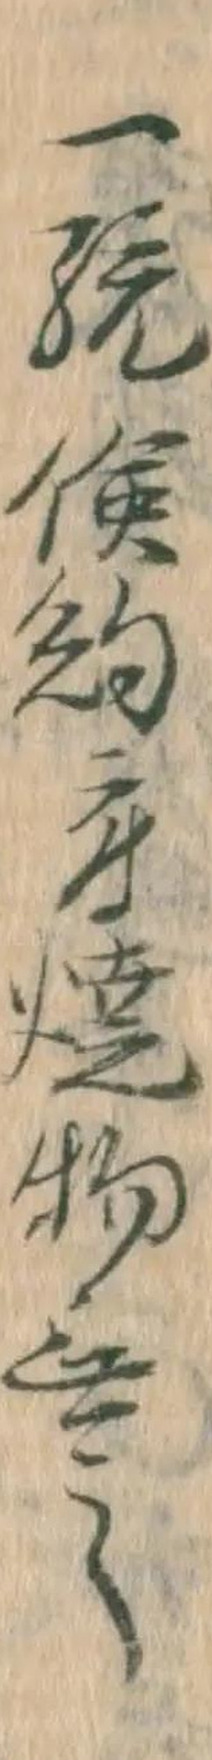一統倹約ニ付焼物無之
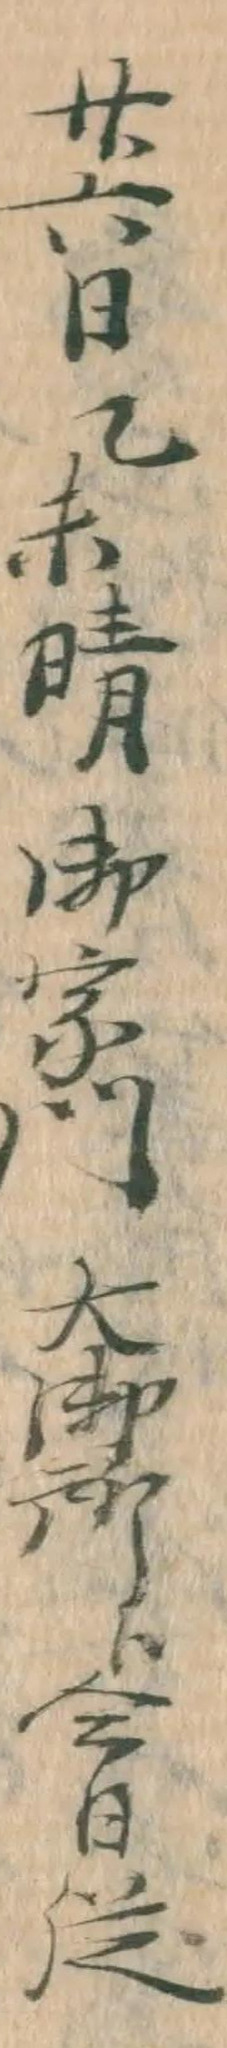廿六日乙未晴御家門大御所え今日従
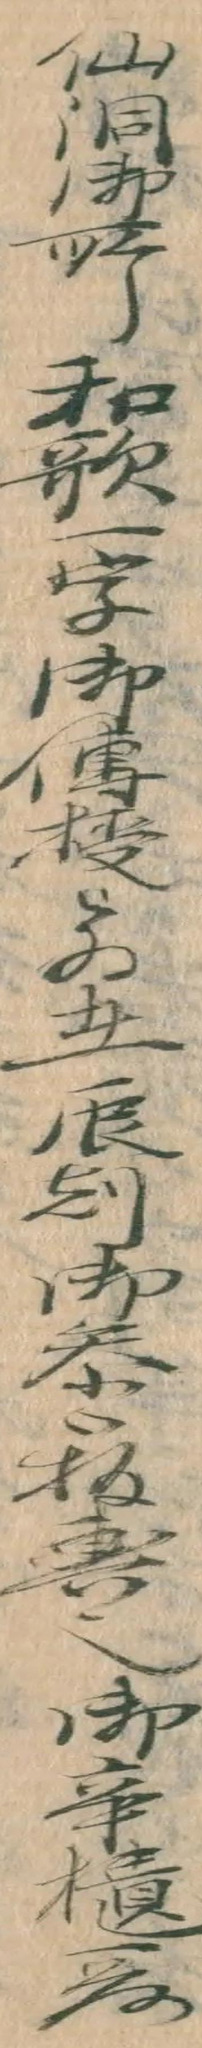仙洞御所和歌一字御傳授被為在辰刻御参御板輿也御辛櫃受
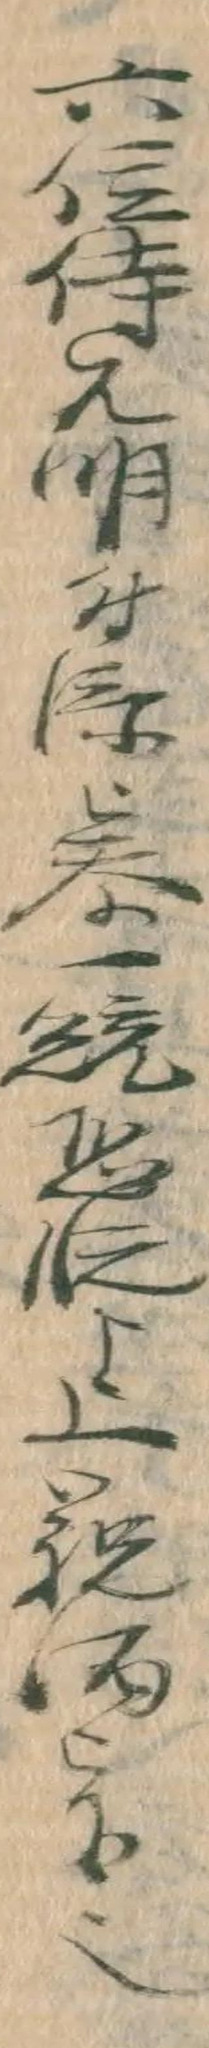六位侍元明付添被参一統恐悦申上御祝酒被下也
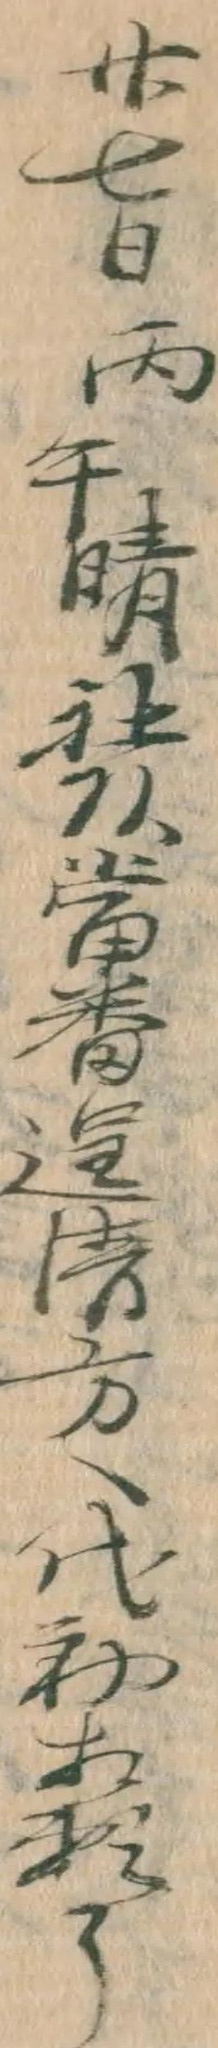廿七日丙午晴社頭當番逞清方へ代勤相頼候
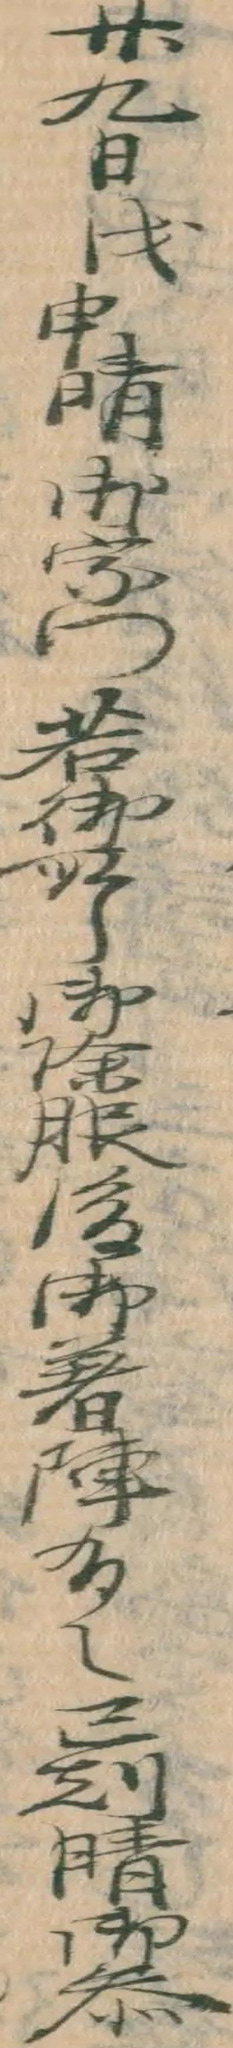廿九日戊申晴御家門若御所御除服後御着陣有之巳刻晴御参
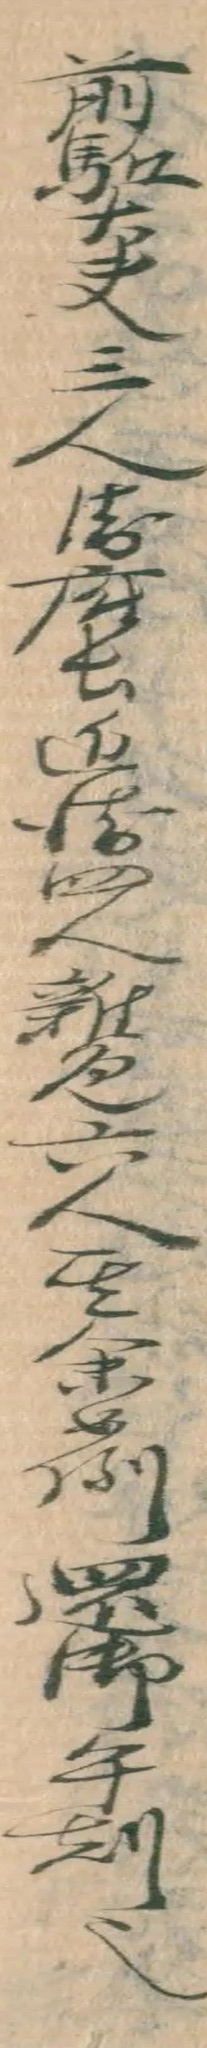前駈大夫三人衛府土長近衛四人雑色六人其余如例還御午刻也
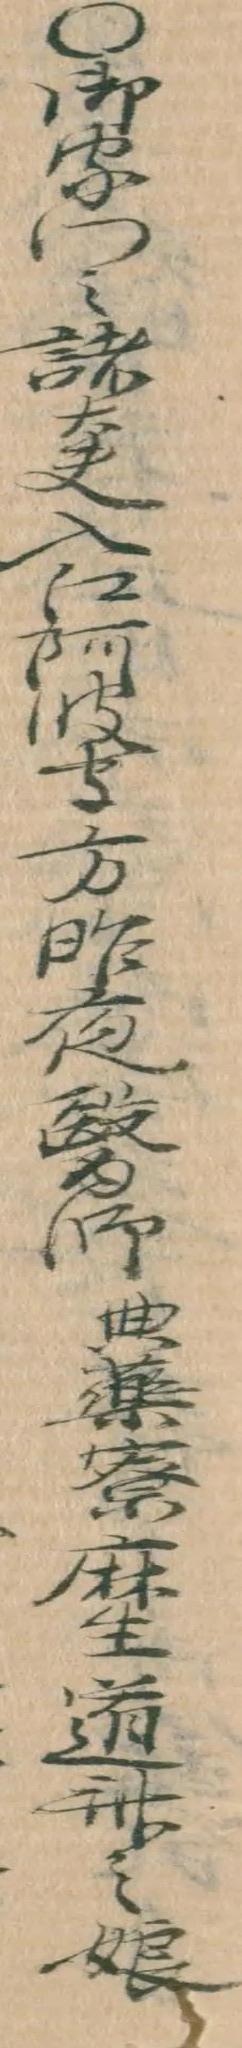○御家門之諸大夫入江阿波守方昨夜醫師典薬寮麻生道斎之娘
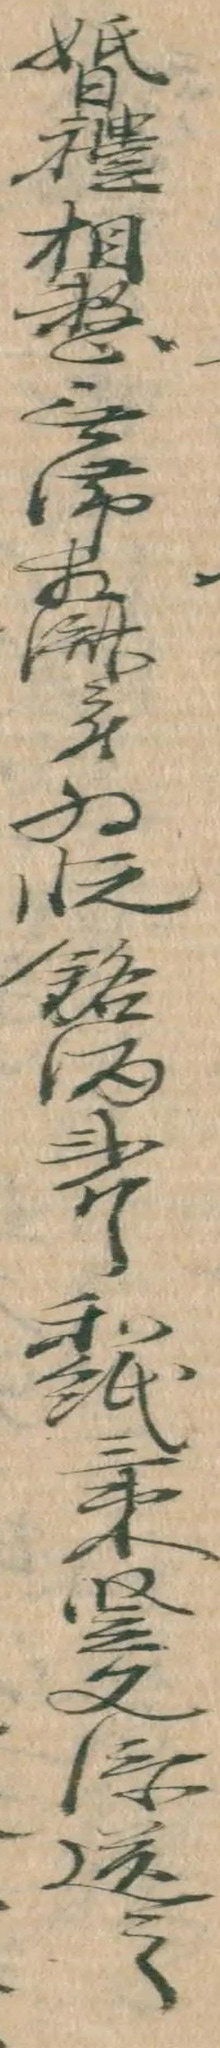婚禮相整無滞相済ニ付為祝銘酒弐斤和紙三束堅又添送之
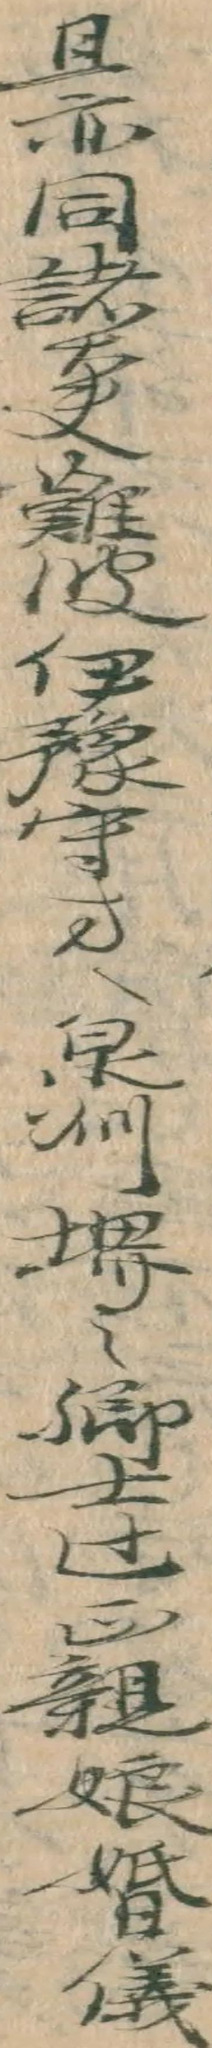且亦同諸大夫難波伊豫守方へ泉州堺之郷士辻正親娘婚儀
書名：賀茂社記録. 第65冊
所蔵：国立国会図書館 National Diet Library, JAPAN
